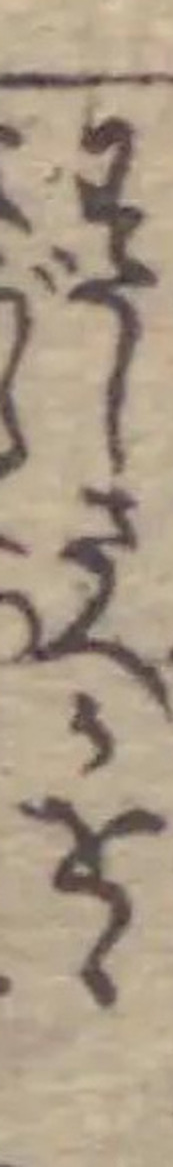わたしさへかをゝ
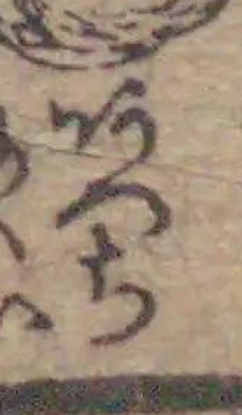あつち
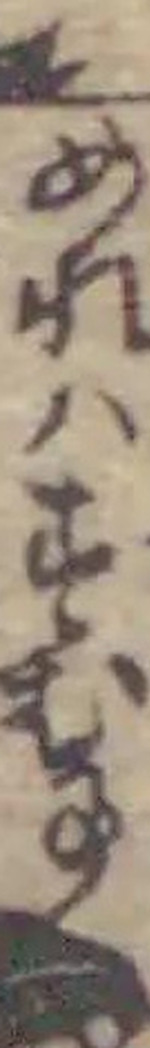めれはすむ事
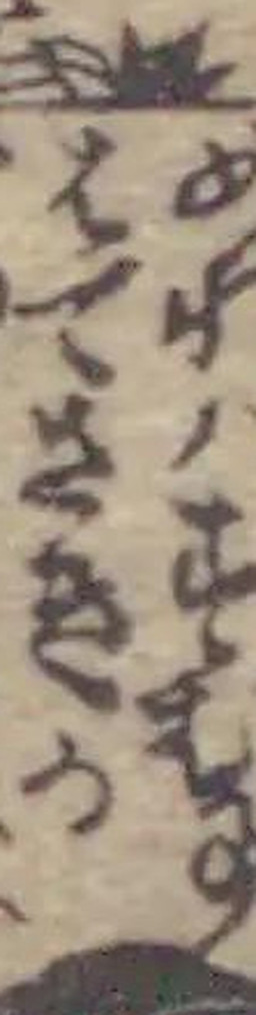はてさきか
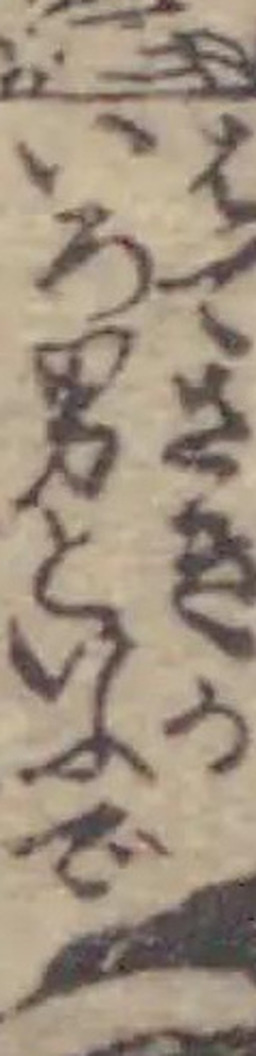いろ男といふで
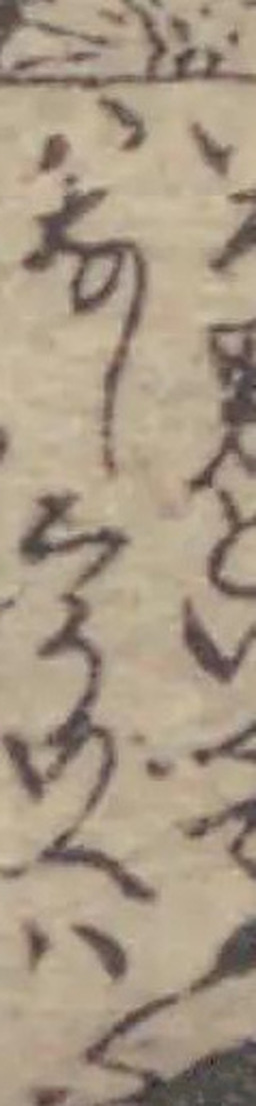はなしこういへは
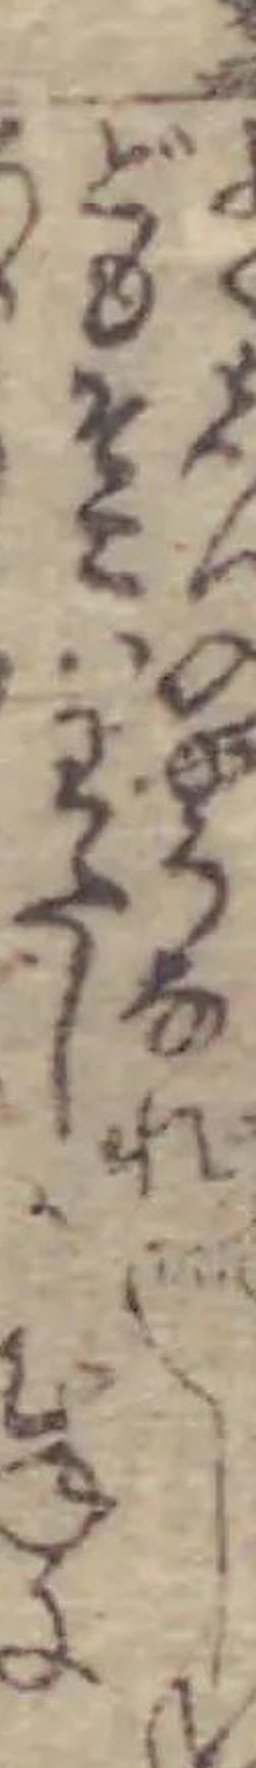どもそこはわたしかむねに
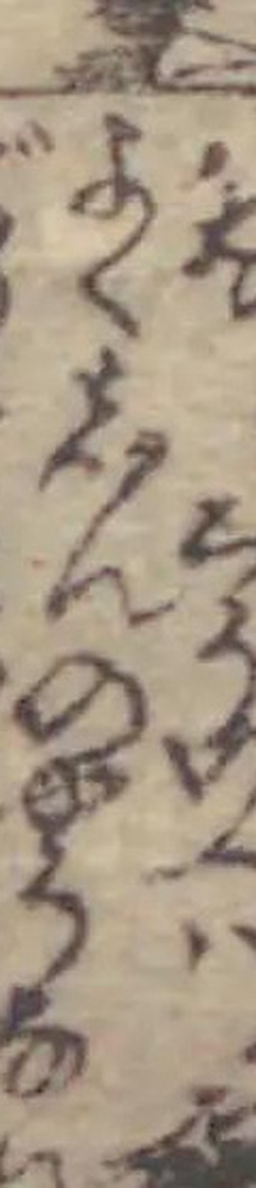よくしんのやうなれ
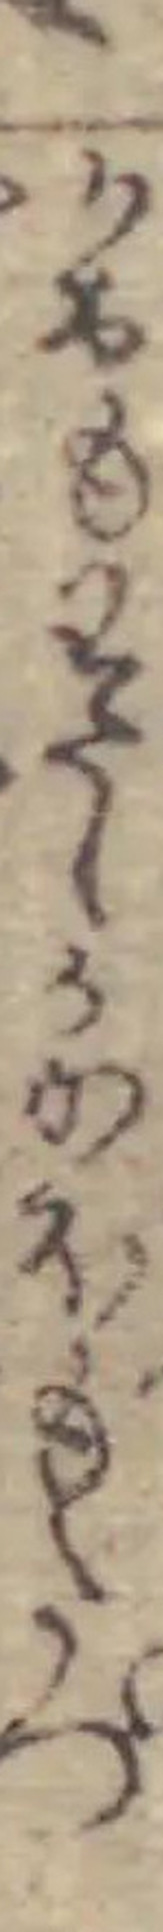かおもわたしかかほもたつ
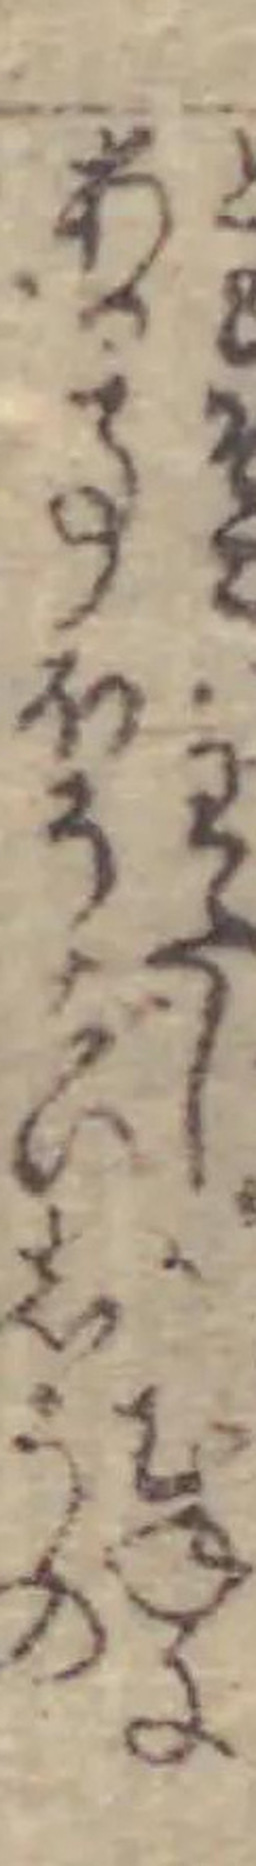ある事ほうごいしうの
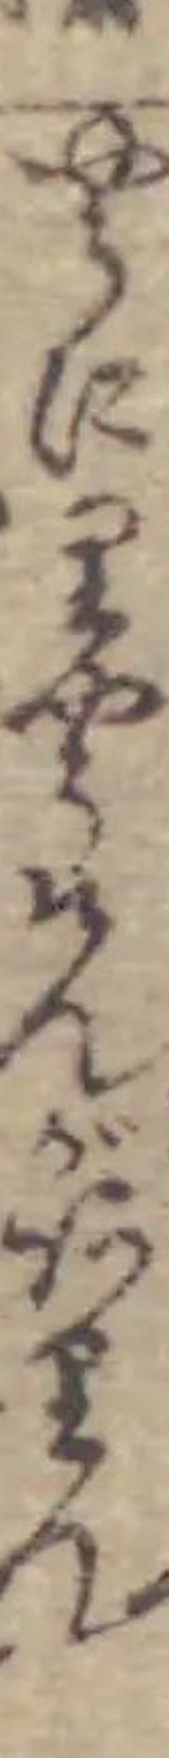やうにりやうけんがありん
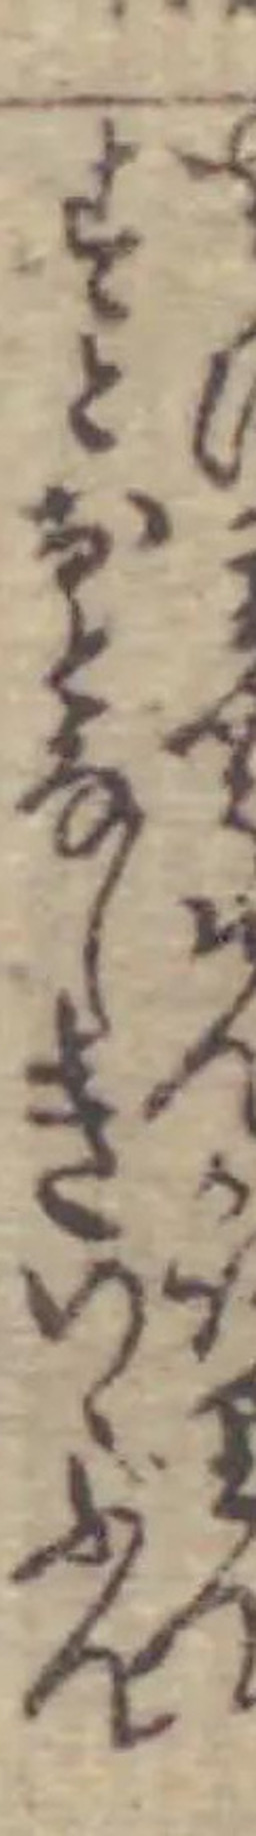すとおとなしきいゝぶん
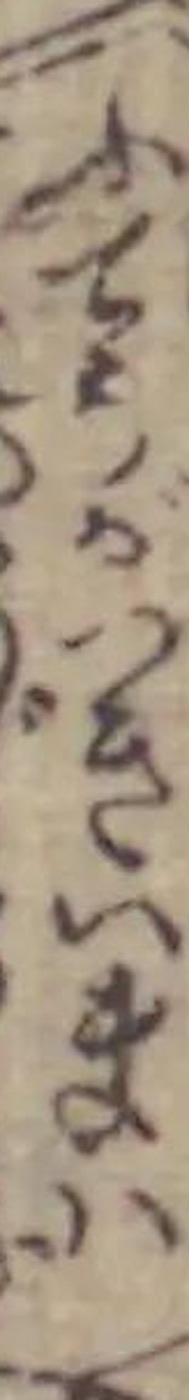ふてうがつきいまは
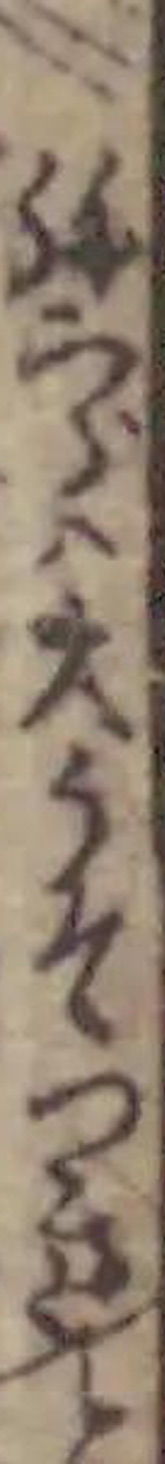弥二郎は大うそつきと
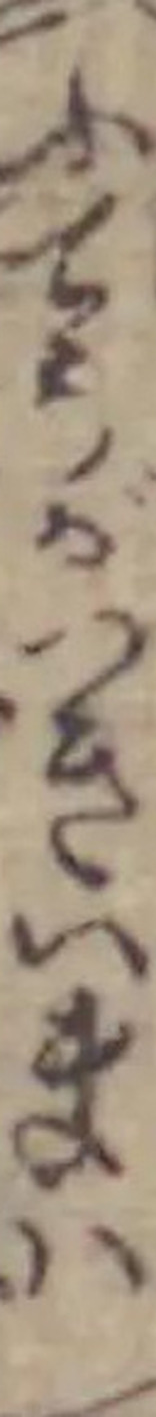ふてうがつきいまは
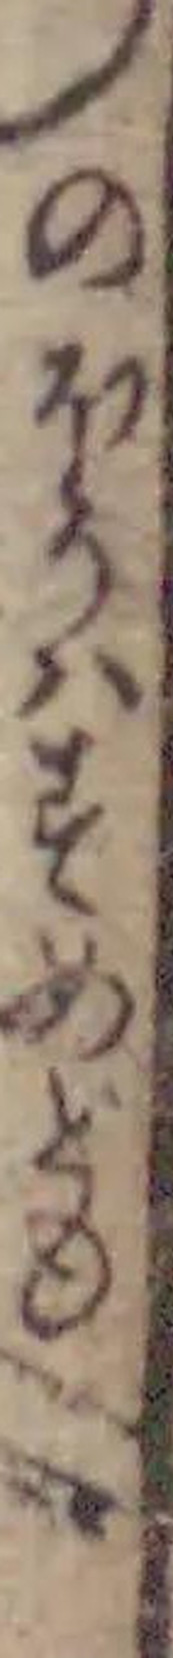のほうはすめども
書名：虚言弥二郎傾城誠 3巻
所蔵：国立国会図書館 National Diet Library, JAPAN
